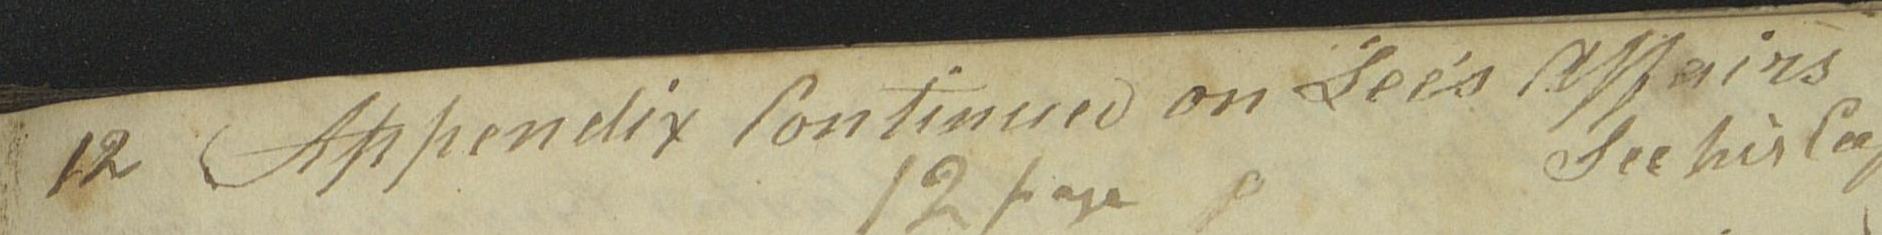12. Appendix Continued on Lee's Affairs
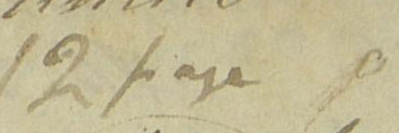12 page
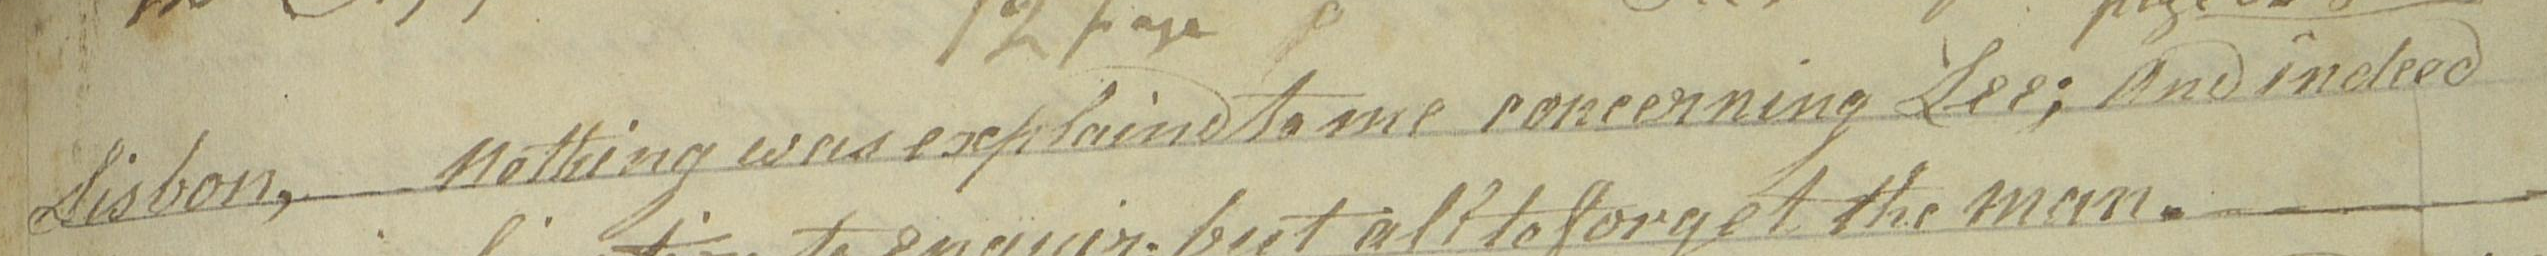Lisbon, Nothing was explaind to me concerning Lee; And indeed
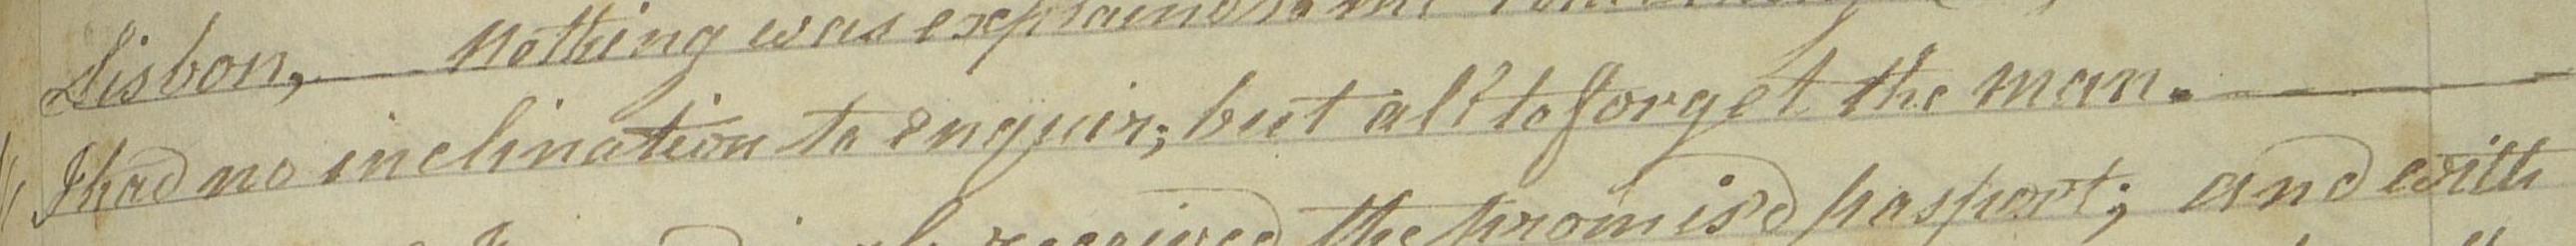I had no inclination to enquir; but all to forget the man.
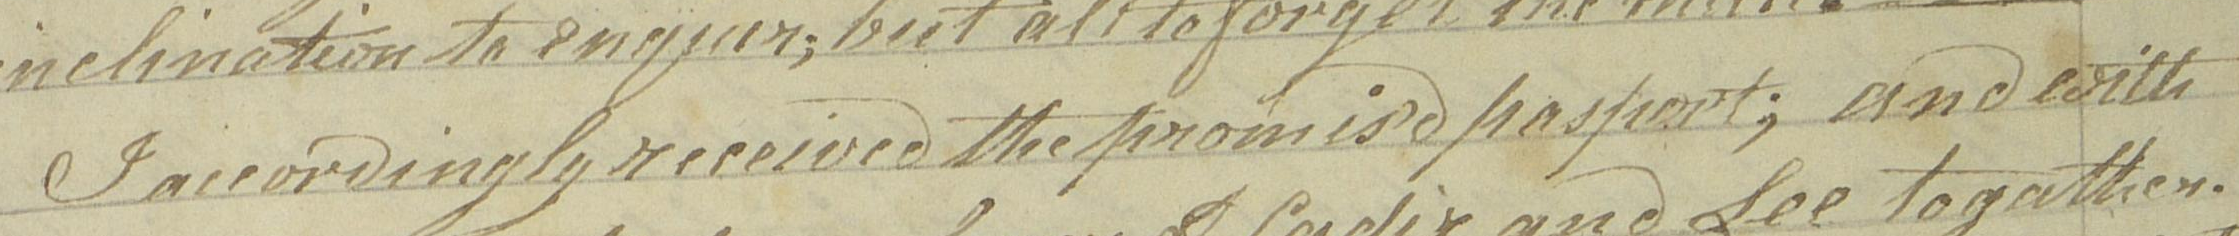I accordingly received the promis'd pasport; and with
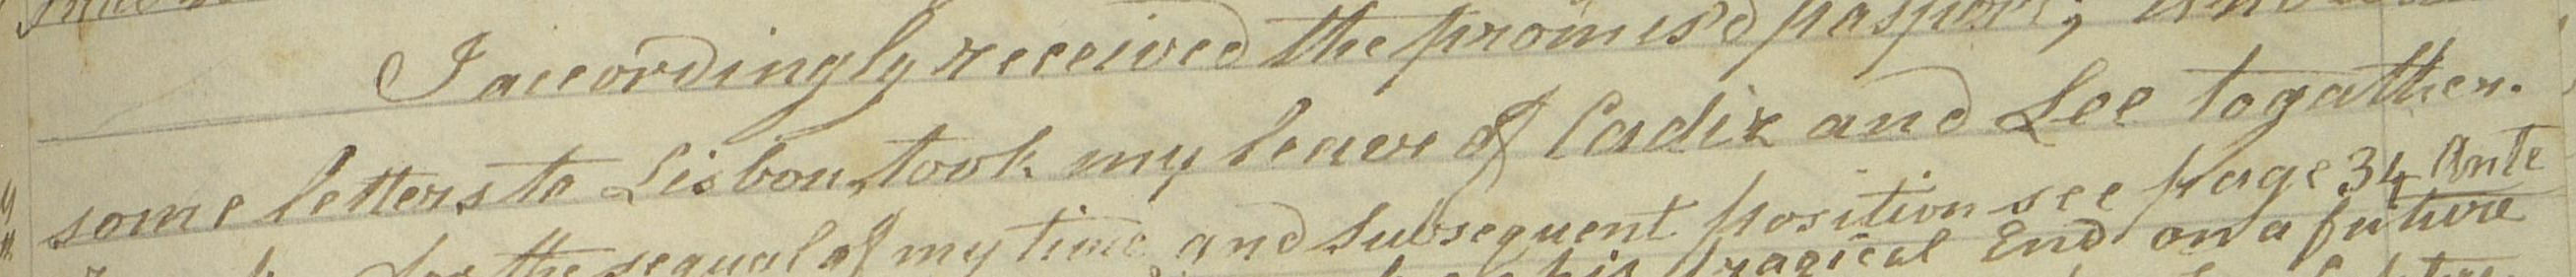some letters to Lisbon, took my leave of Cadiz and Lee togather.
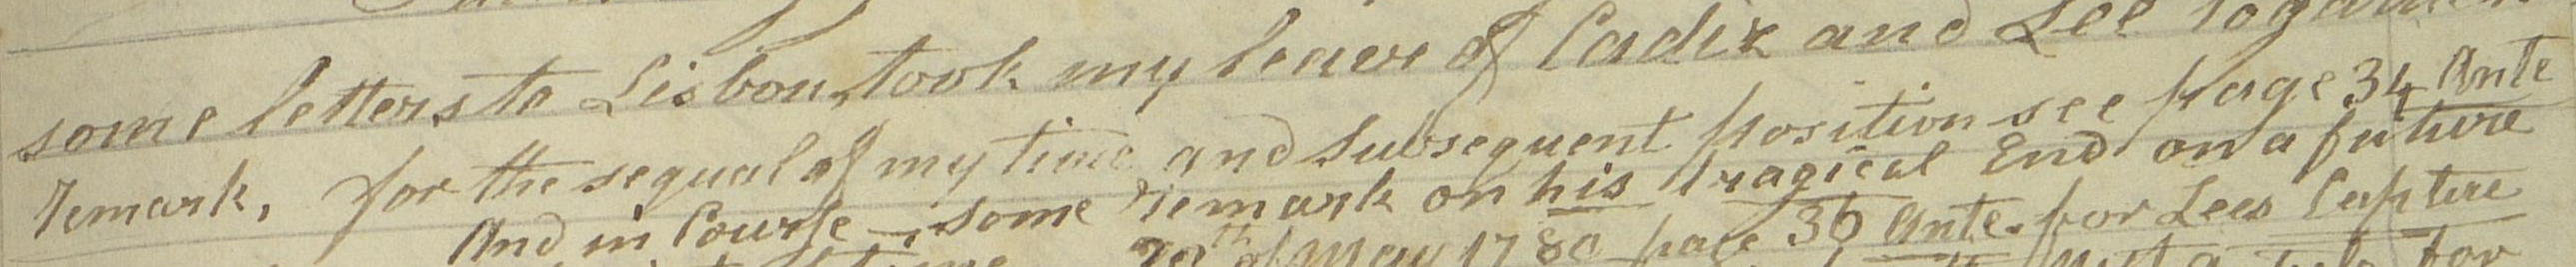Remark, for the sequal of my time and subsequent position see page 34 Ante
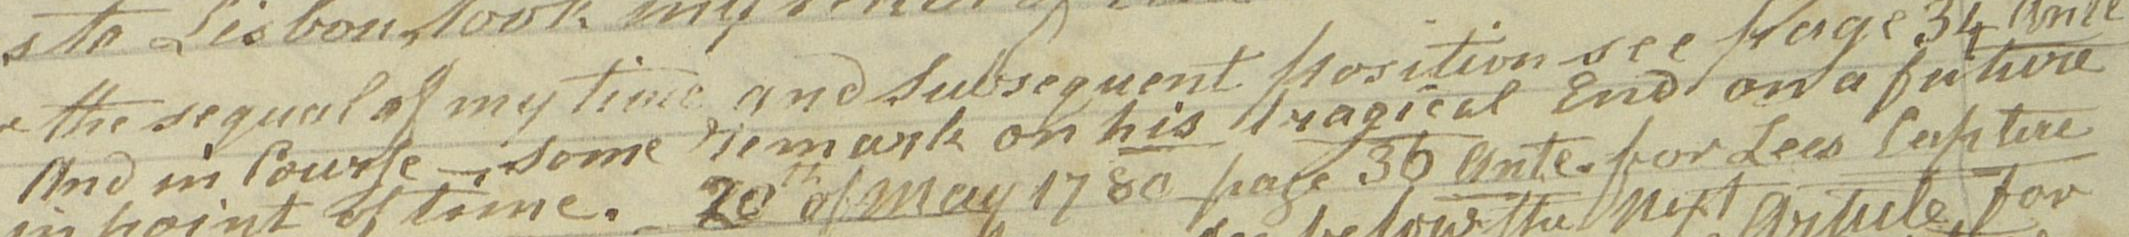And in Course, some remark on his tragical End on a future
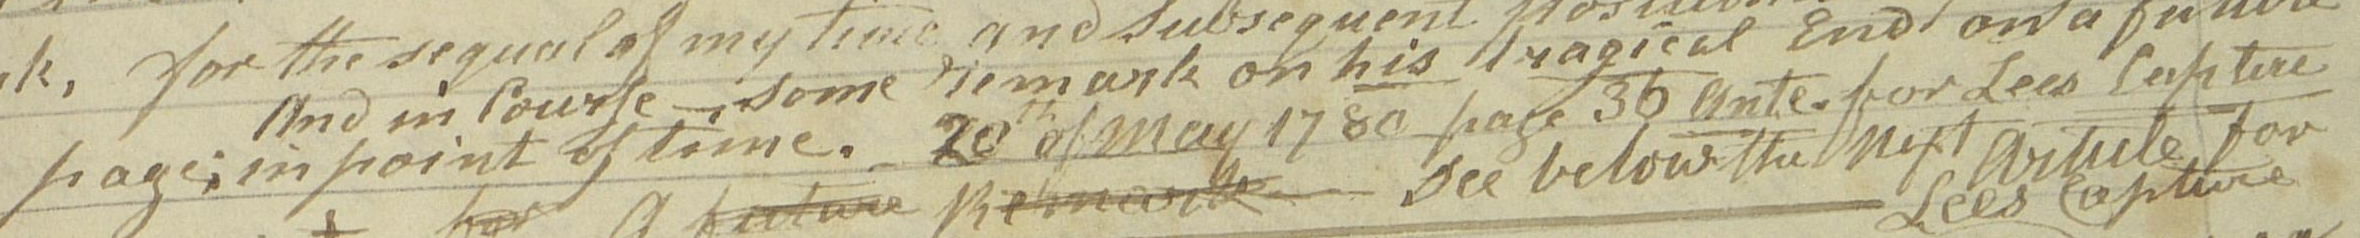page; in point of time. 20^th of May 1780 page 36 Ante for Lees Capture
